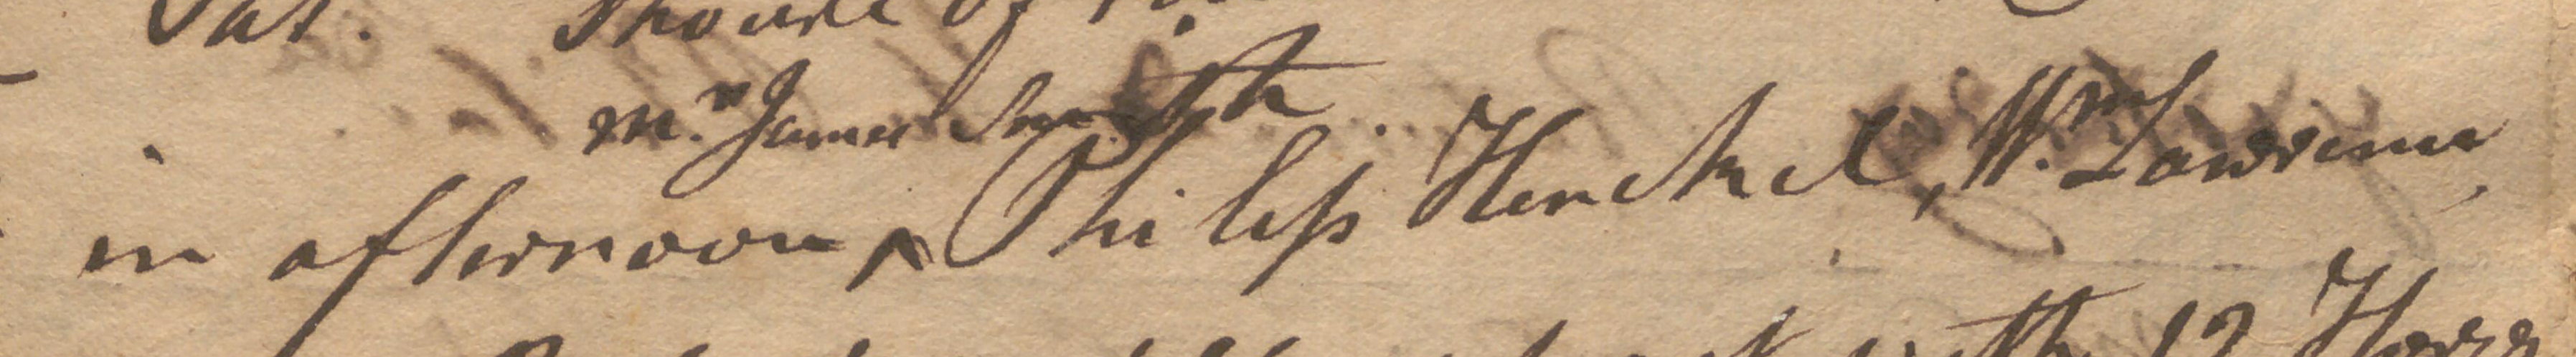in afternoon ^ Philip Henckel W^m Lawrence
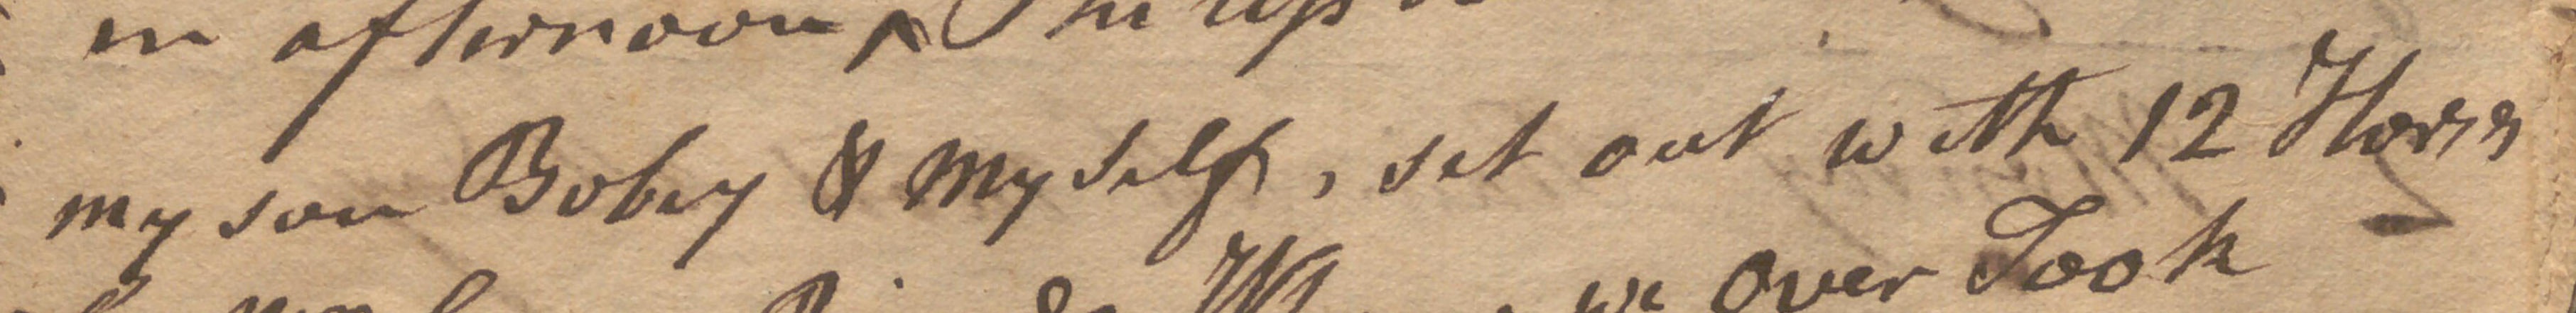my soue Bobey & myself, set out with 12 Horses
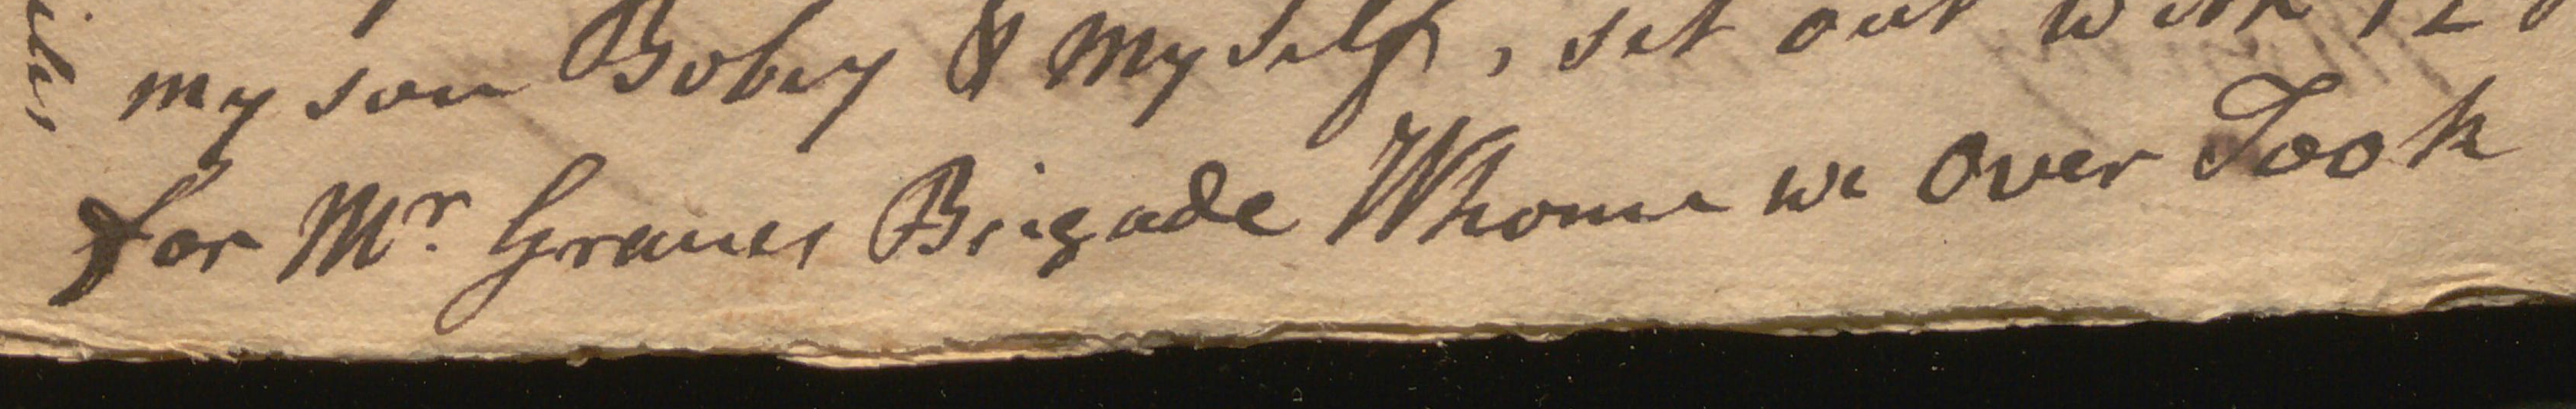for M^r. Graveses Brigade Whome we over Took
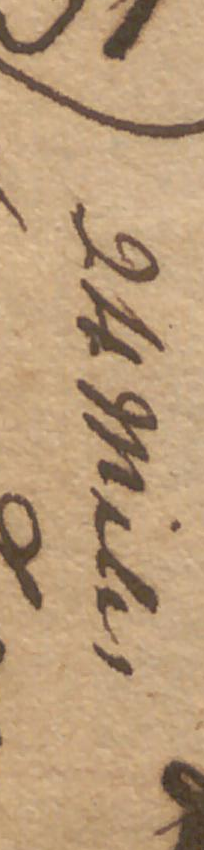24 Miles
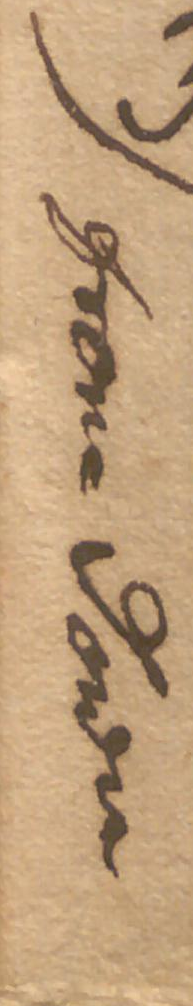frone Town
